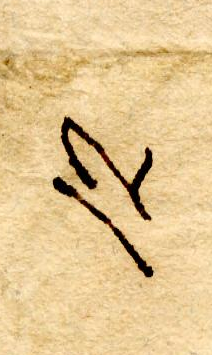12
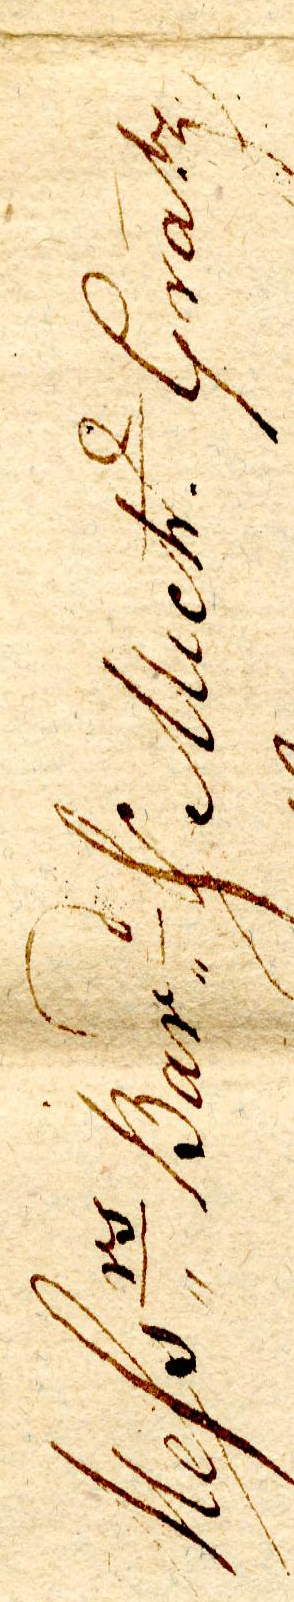Mes^rs Bar^d & Mich^l Gratz
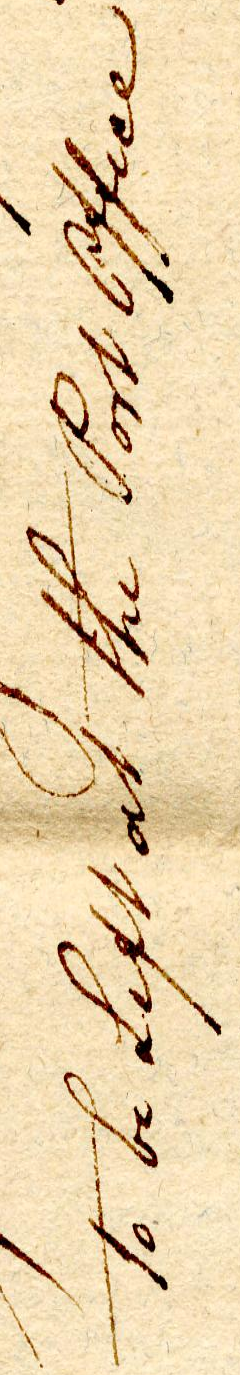to be left at the post office
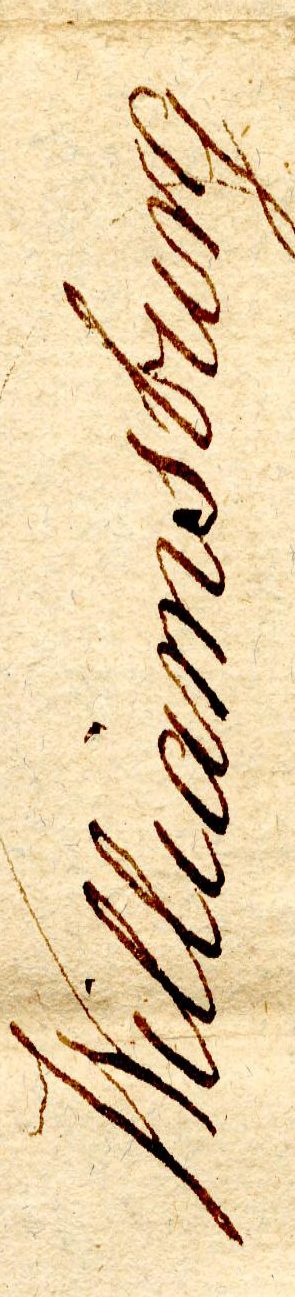Williamsburg
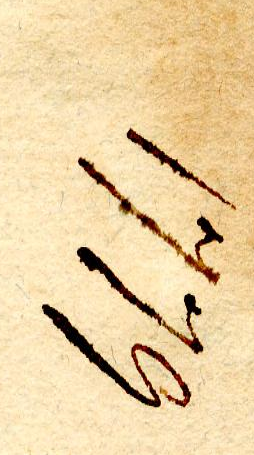1779
